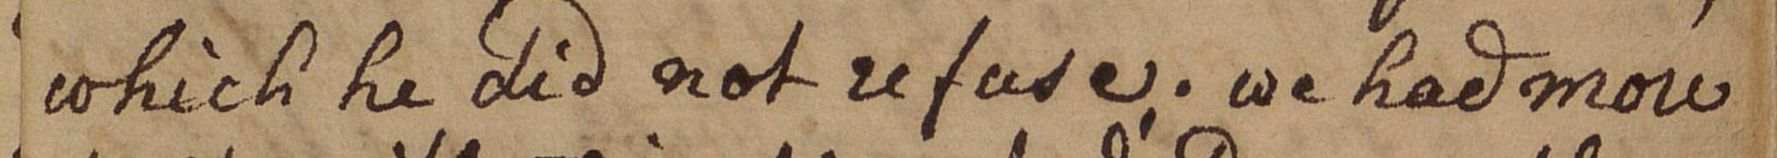which he did not refuse; we had more
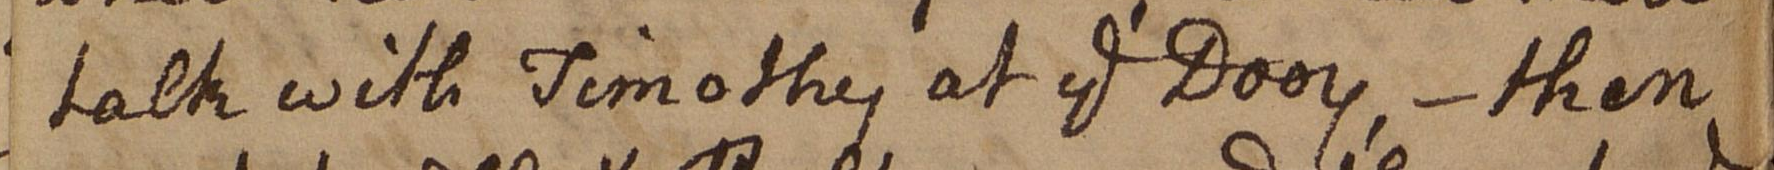talk with Timothy at y^e Door-then
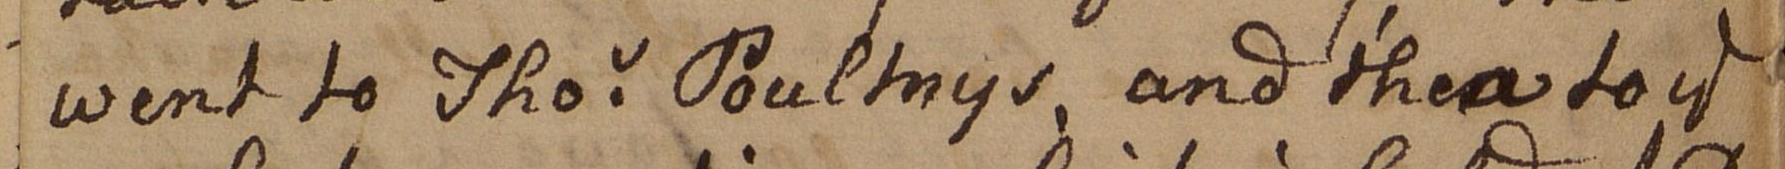went to Tho^s. Poultnys, and then to y^e
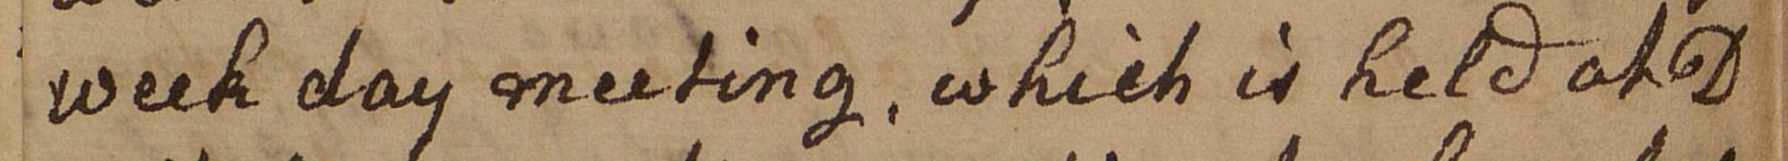week day meeting, which is held at D
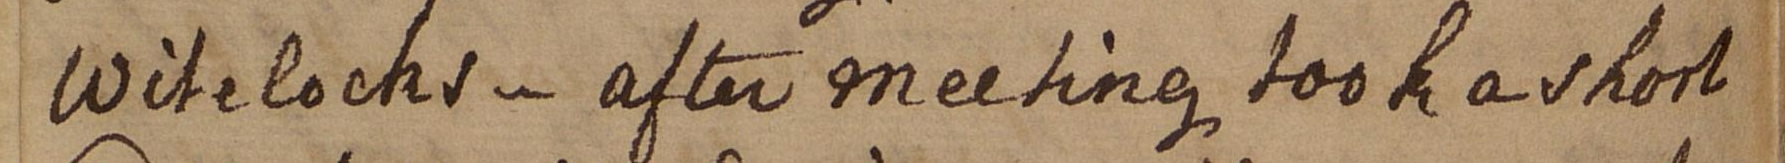Witelocks- after meeting, took a short
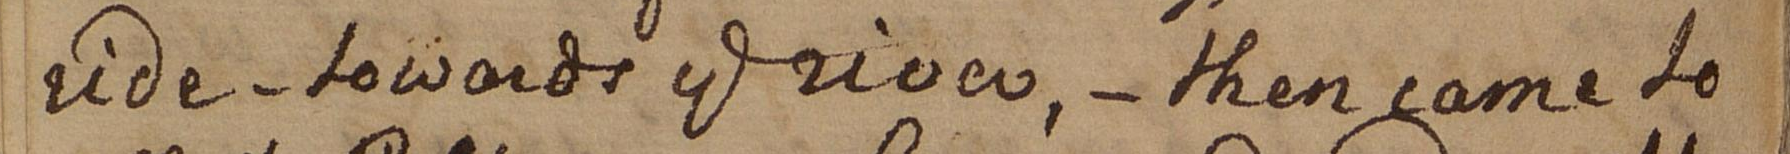ride- towards y^e river,- then came to
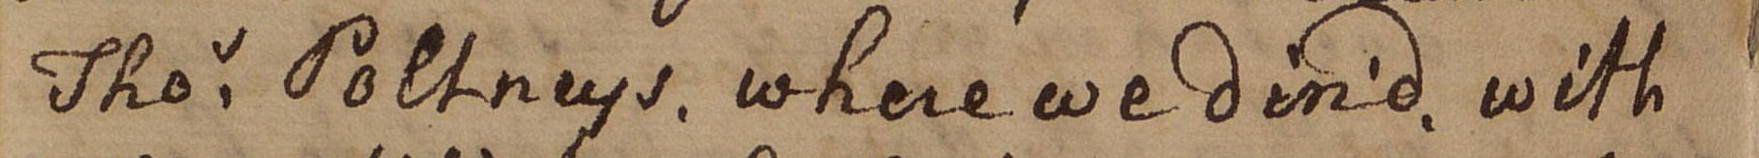Tho^s. Poltneys, where we dind, with
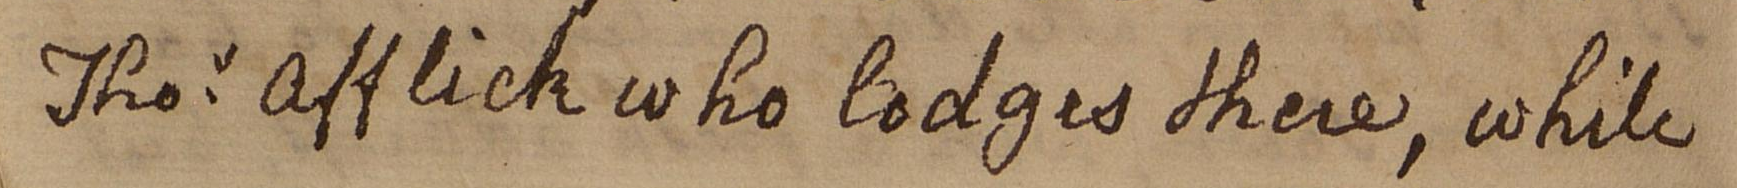Tho^s. Afflick who lodges there, while
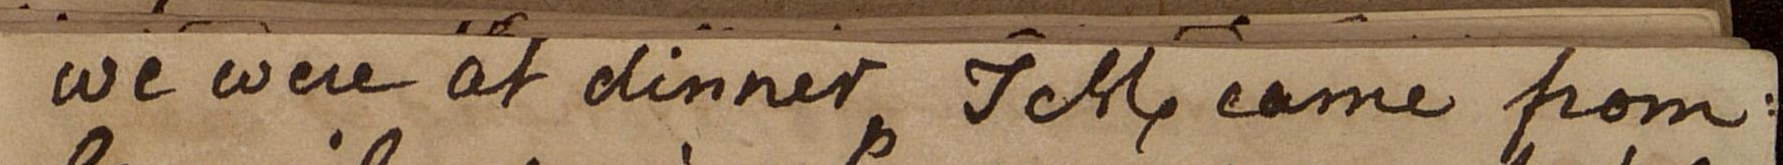we were at dinner, TM came from
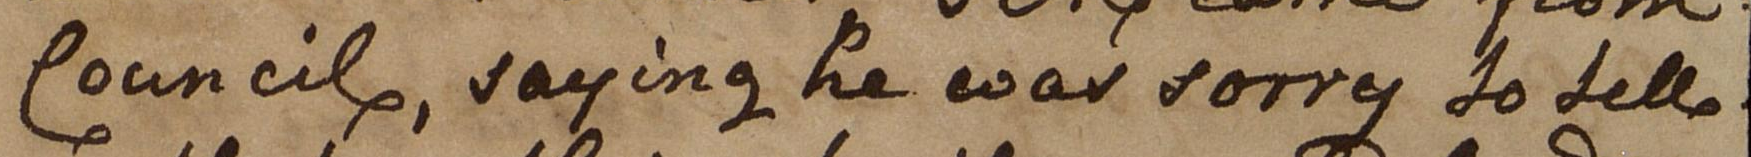Council, saying he was sorry to tell
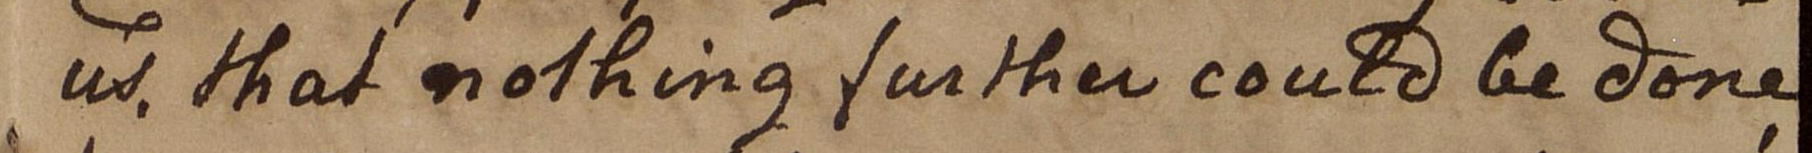us, that nothing further could be done,
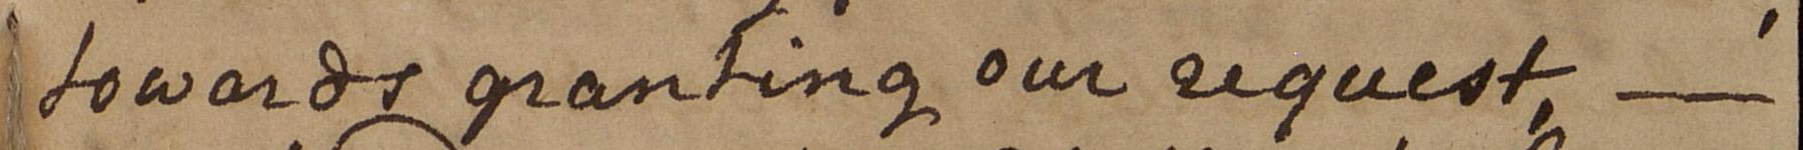towards granting our request,-
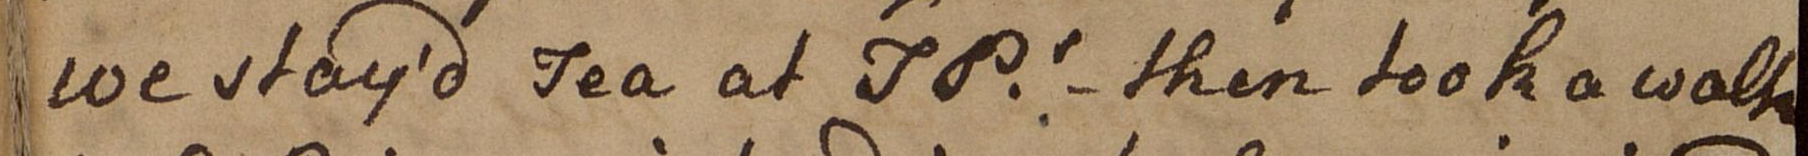we stay'd Tea at TP^s.- then took a walk
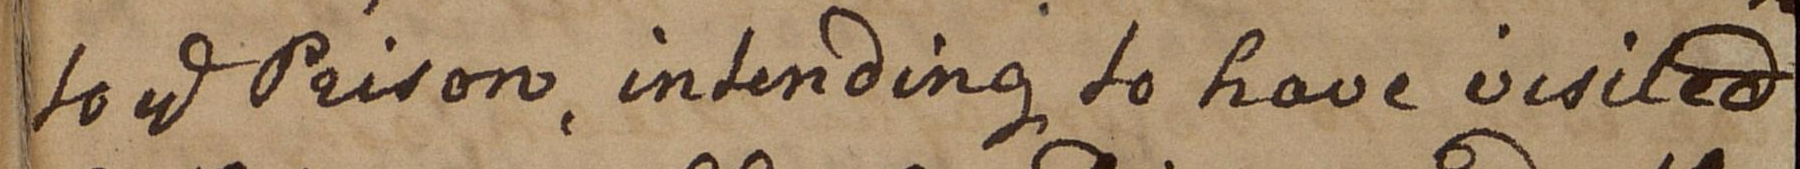to y^e Prison, intending to have visited
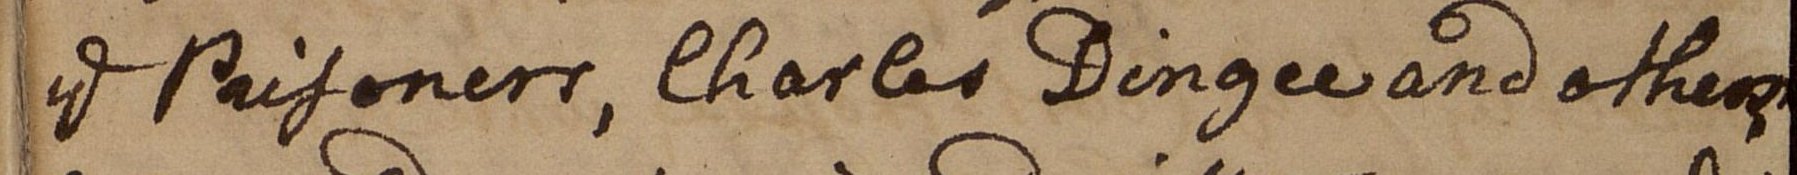y^e Prisoners, Charles Dingee and others
